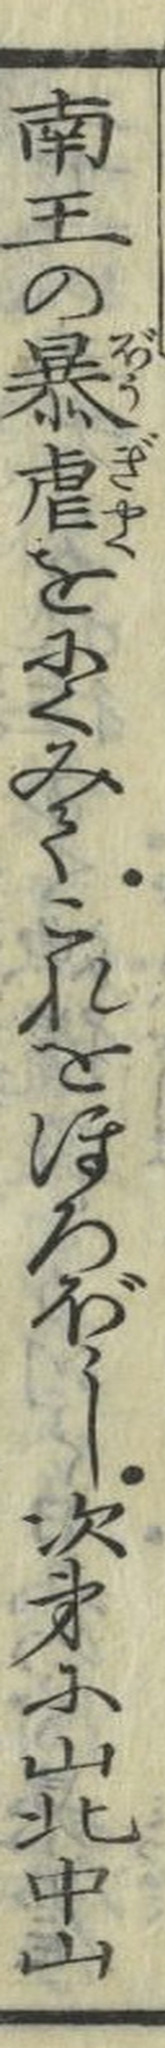南王の暴虐をにくみて・これをほろぼし・次第に山北中山
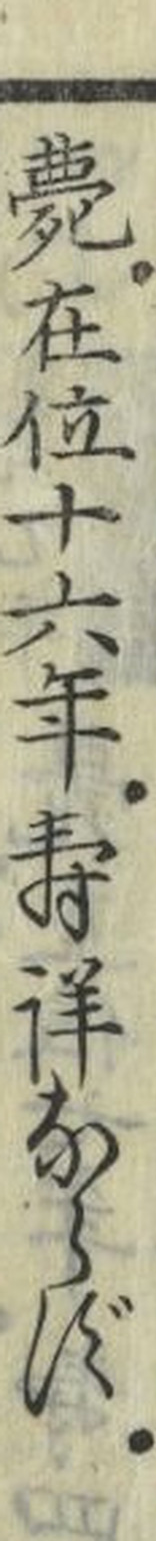薨・在位十六年・寿詳ならず・
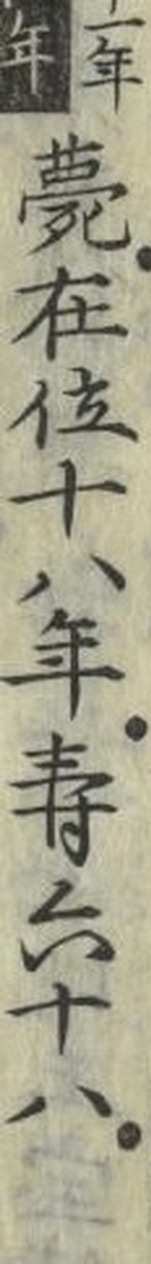薨・在位十六年・寿詳ならず・

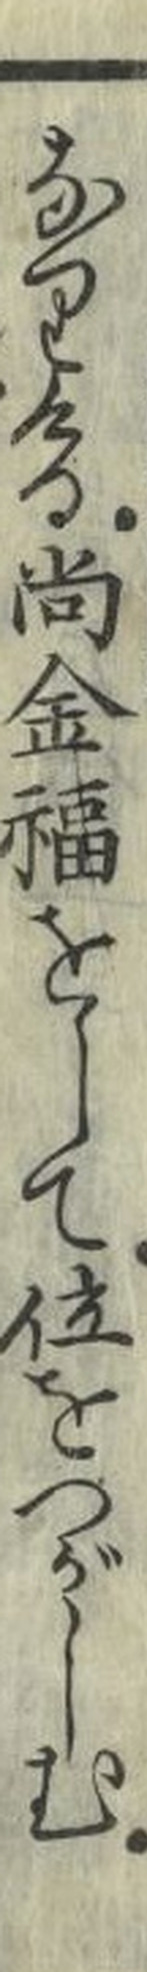なりける・尚金福をして・位をつがしむ・
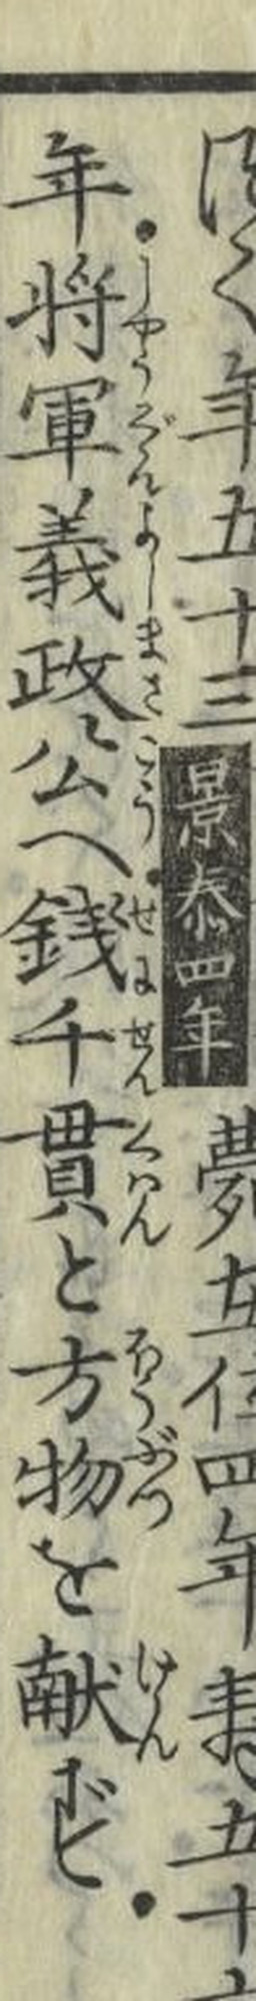年・将軍義政公へ銭千貫と方物を献ず・
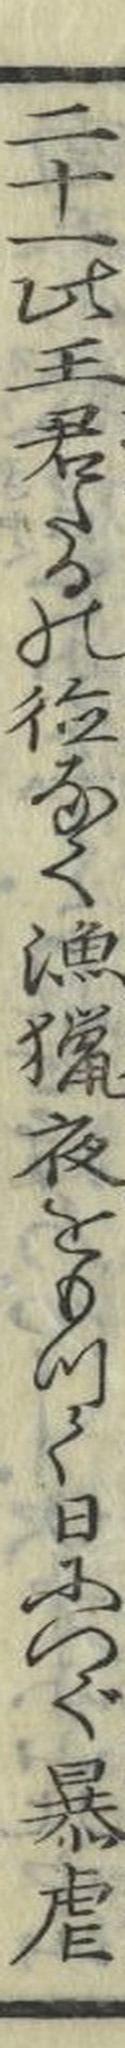二十一・此王君たるの徳なく・漁猟夜をもつて日につぐ・暴虐
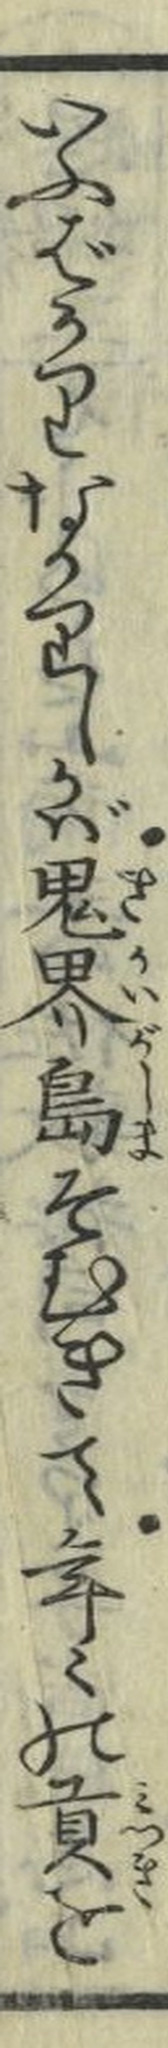いふばかりなかりしかば・鬼界島そむきて・年々の貢を
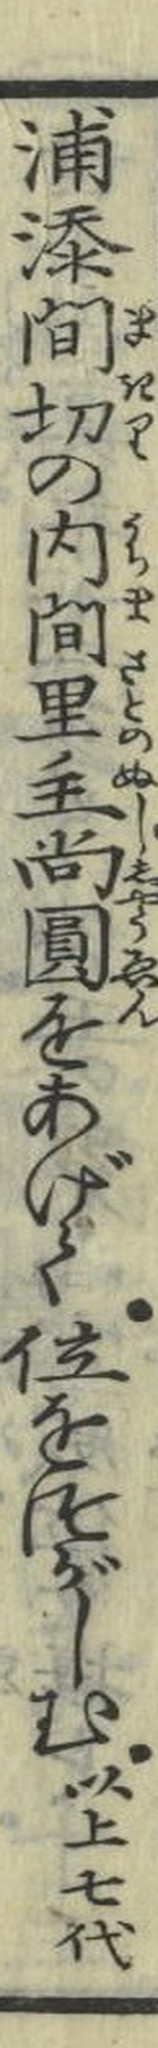浦添/間切の内間里主・尚円をあげて・位をつがしむ・以上七代
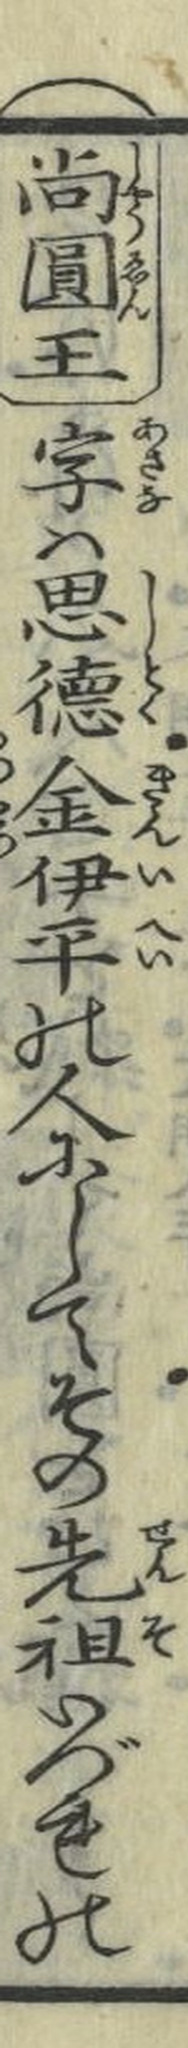尚円王字は思徳・金伊平の人にして・その先祖いづれの
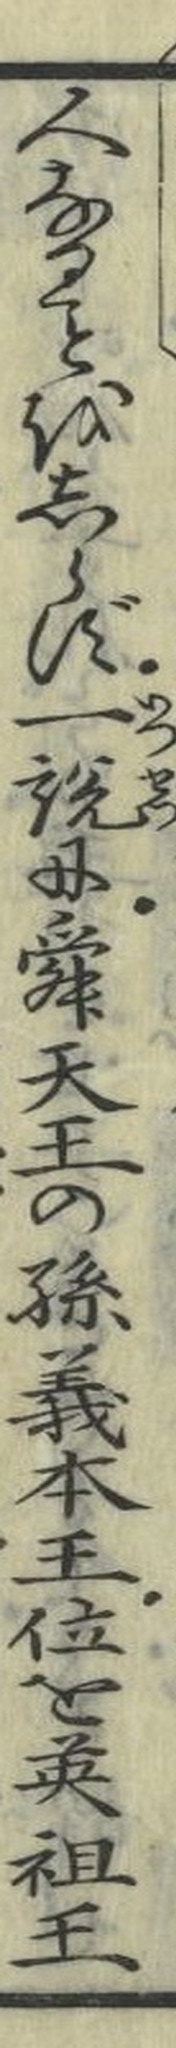人なりとをしらず・一説に・舜天王の孫義本王・位を英祖王
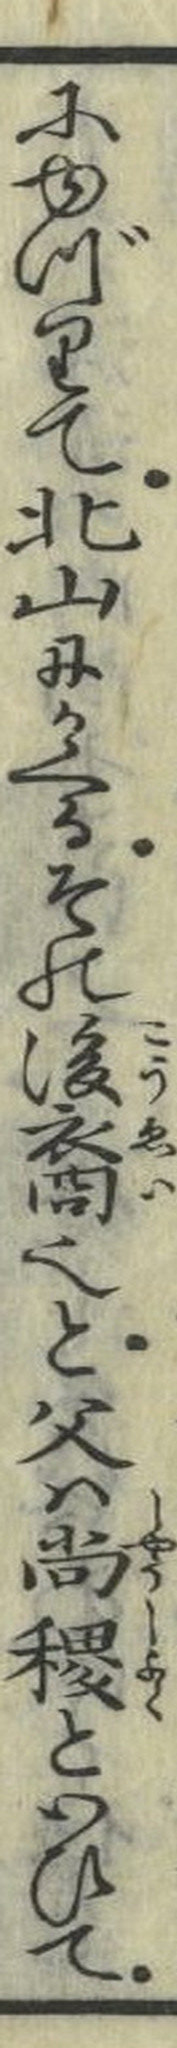にゆづりて・北山にかくる・その後裔也と・父は尚稷といひて・
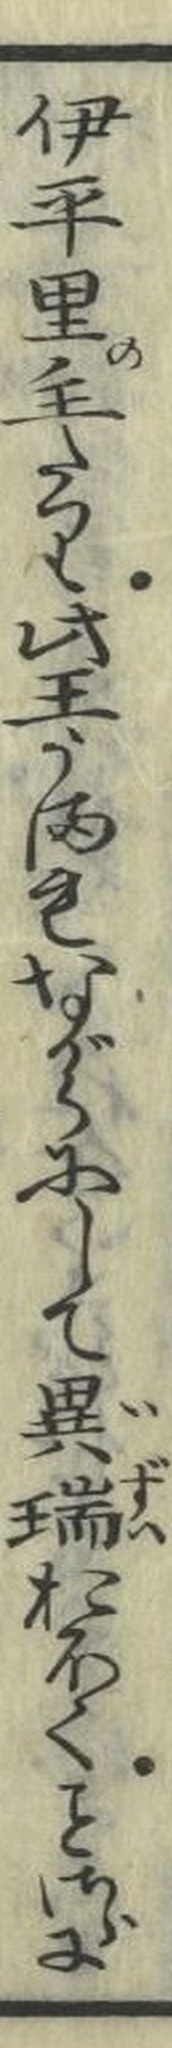伊平里主たり・此王うまれながらにして異瑞おほく・ことさらに
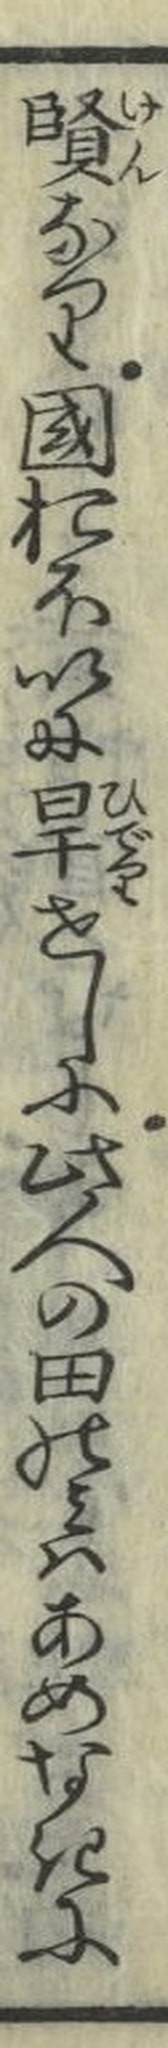賢なり・国おほいに旱せしに・此人の田のみはあめなきに
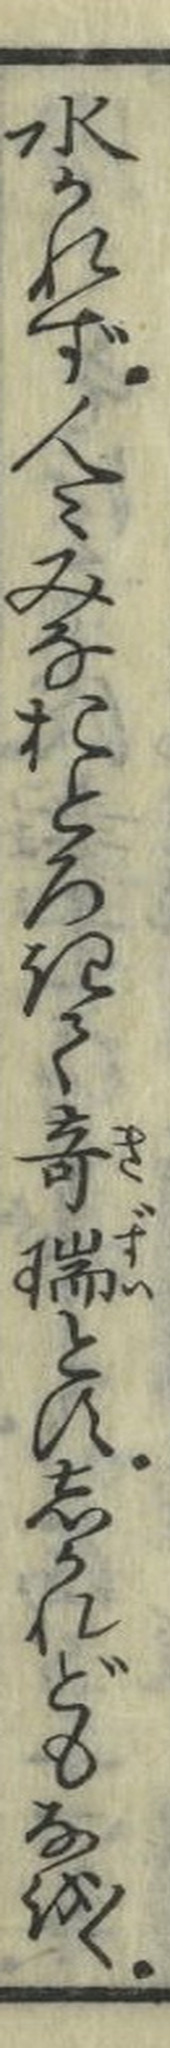水かれず・人々みなおとろきて奇瑞とす・しかれどもなを〳〵・

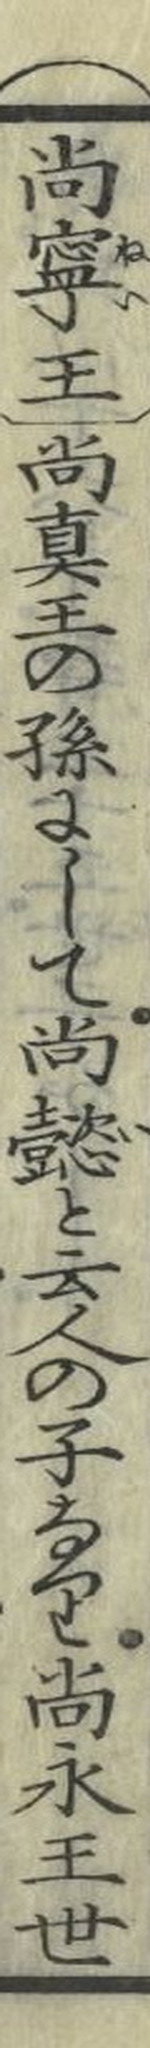(尚寧王)尚真王の孫にして・尚懿と云人の子なり・尚永王世
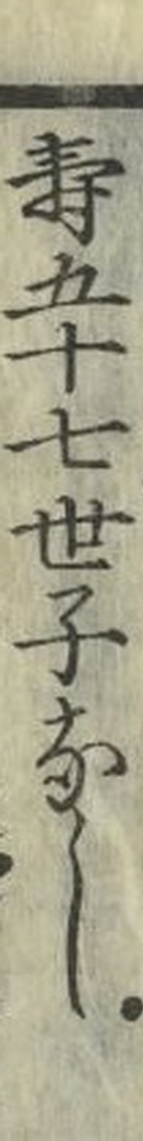寿五十七・世子なし・
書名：琉球秊代記 附雑話 全
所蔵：University of the Ryukyus Library
